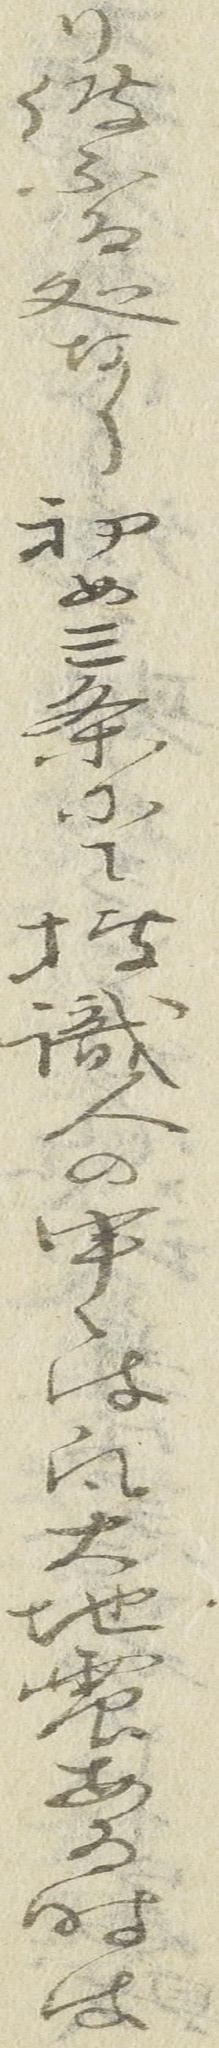り伝ふる処なり初め三条にて披識人の申しゝは凡大地震ある時は
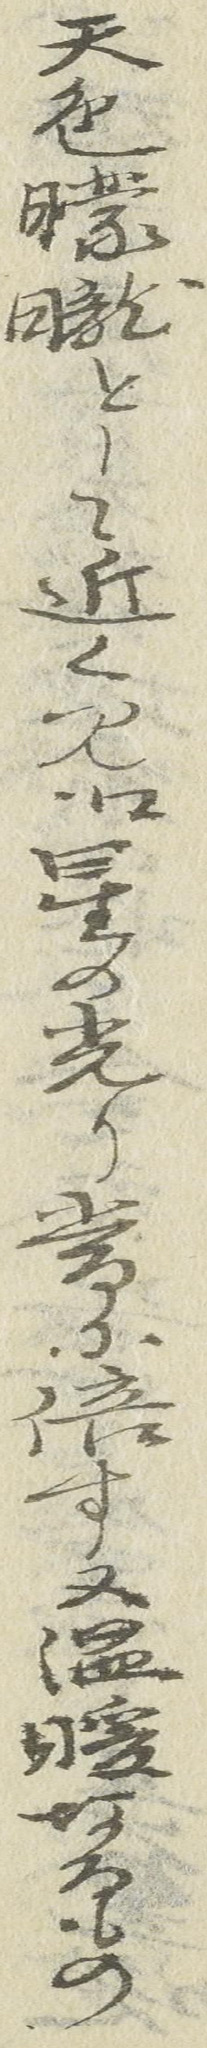天色朦朧として近く見え星の光り常に倍す又温暖なるもの
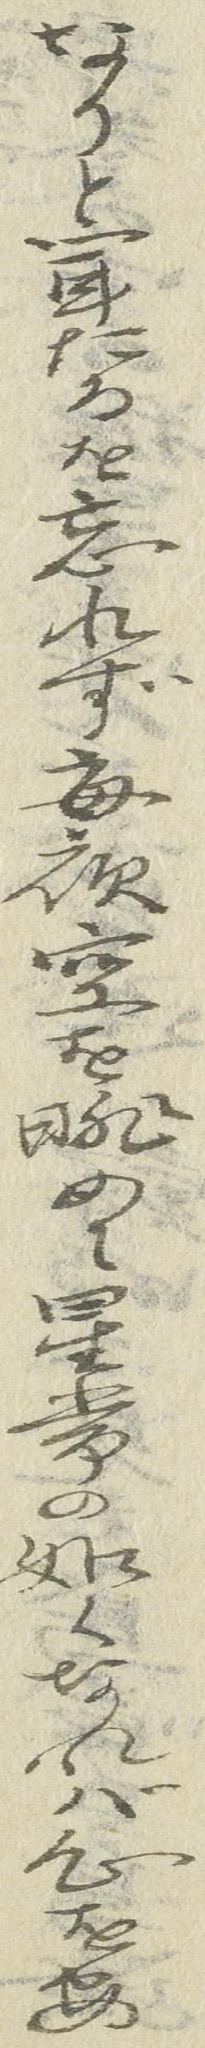なりと聞たるを忘れず毎夜空を眺めて星常の如くなれば心を安
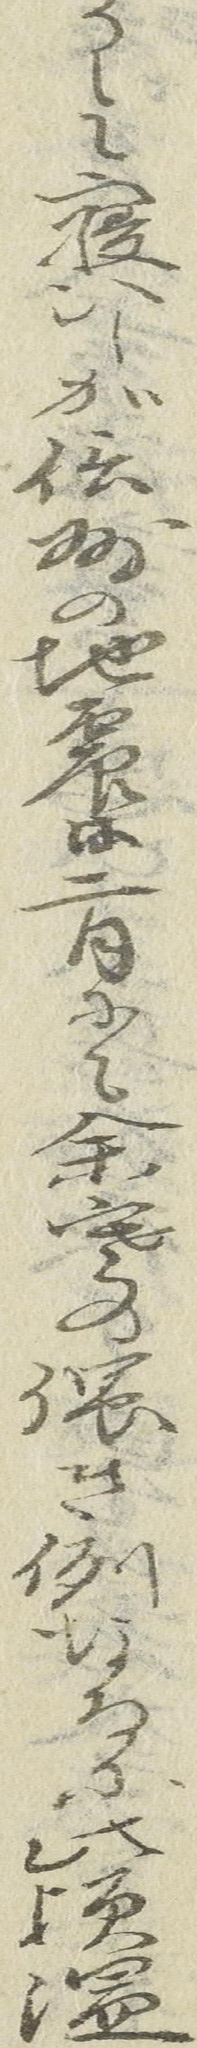うして寝ひしが信州の地震は二月にて余寒の強き例なるに此頃温

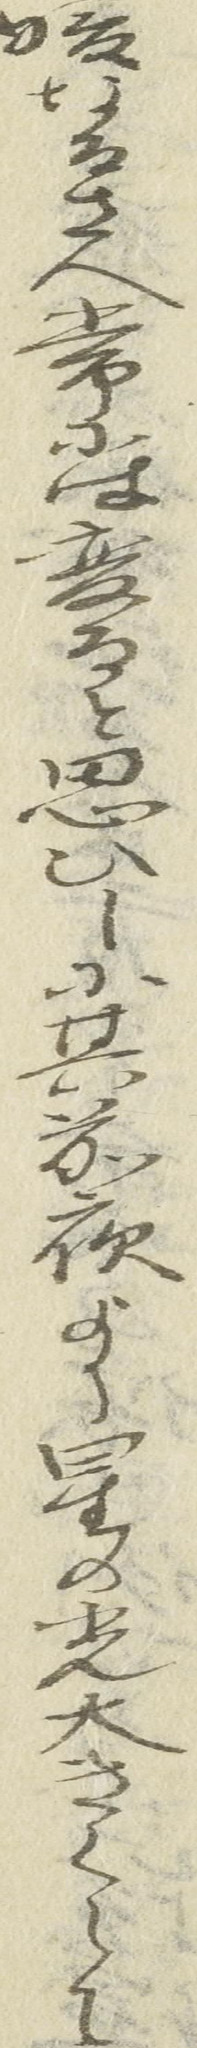暖なるさへ常には変ると思ひしに其前夜より星の光大きくして
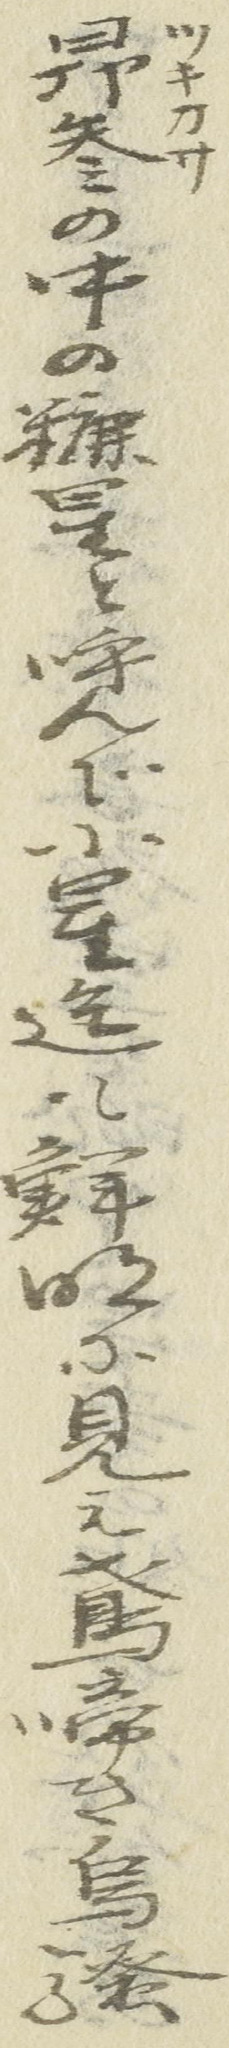昴参の中の糠星と呼んで小星迄も鮮明に見え鳶啼き烏騒
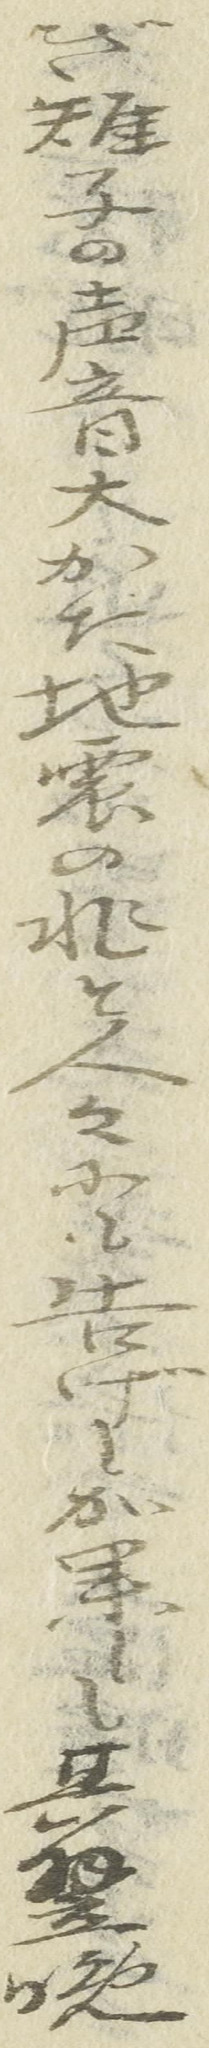ぎ雉子の声音大かた地震の兆と人々にも告げしが果して其翌晩
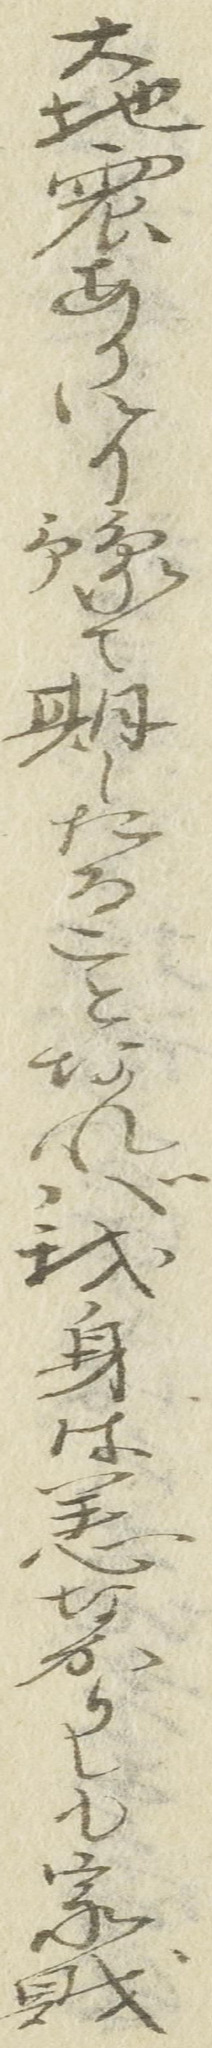大地震ありけり豫て期したることなれば我身は恙なかりしも家財
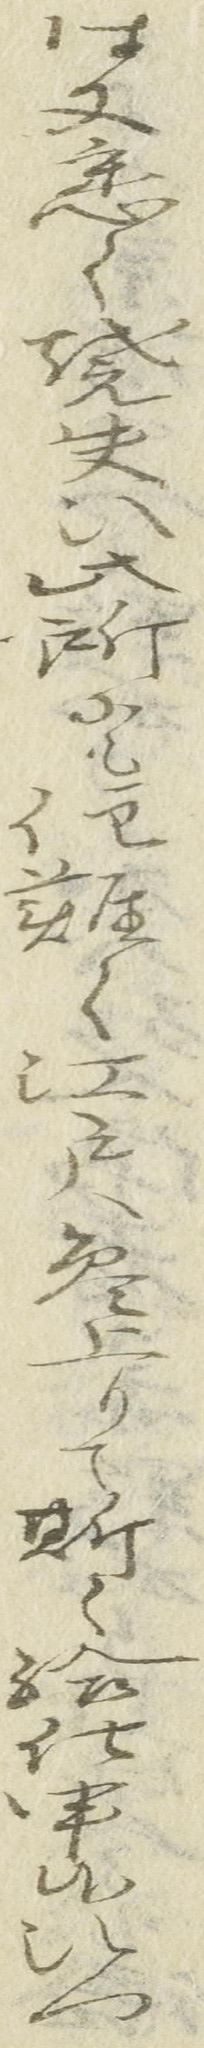は又悉く焼失ひ此所にも住難く江戸へ参上りて斯く給仕申候ひつ
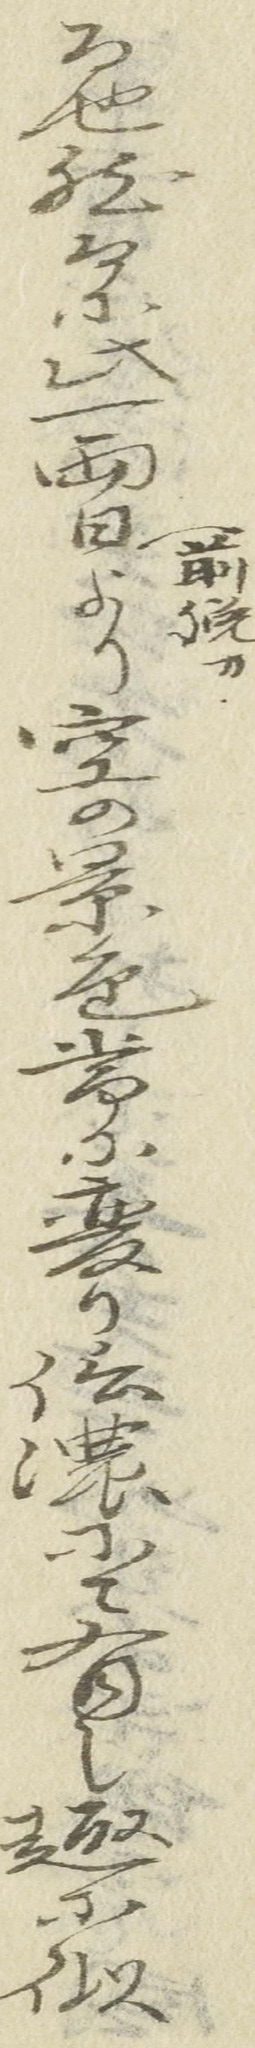る也然るに此一両日より空の景色常に変り信濃にて有し趣に似
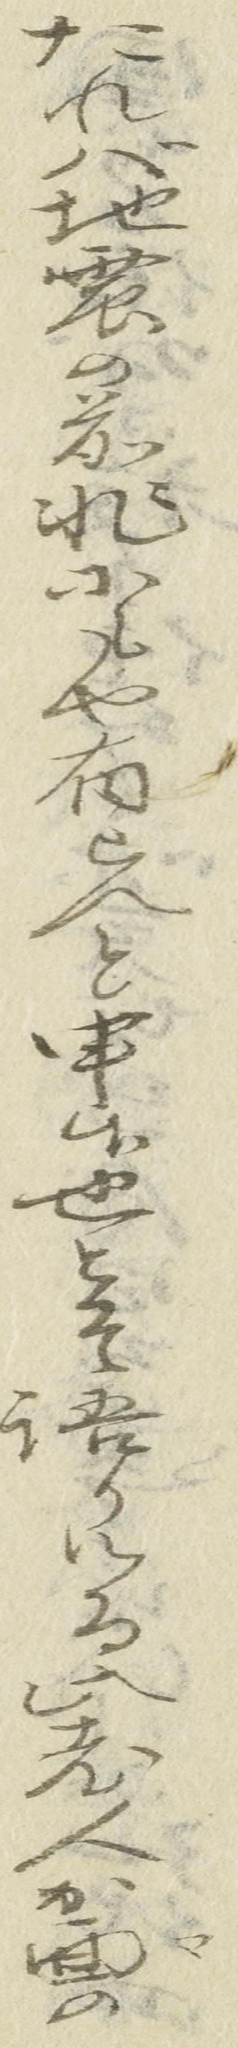たれば地震の前兆にもや有せんと申候也とそ語りける此老人か面の
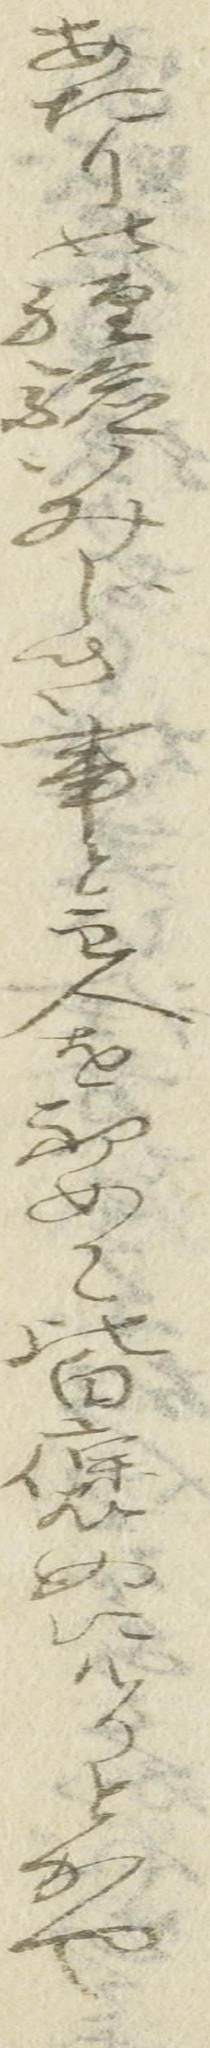あたりの経験いみじき事と主人を初めて皆褒めにけりとかや
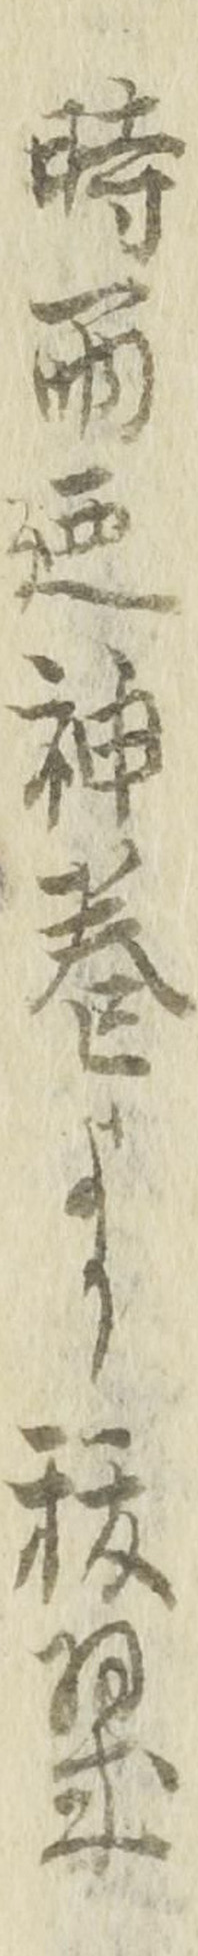時雨廼神巻より秡翠
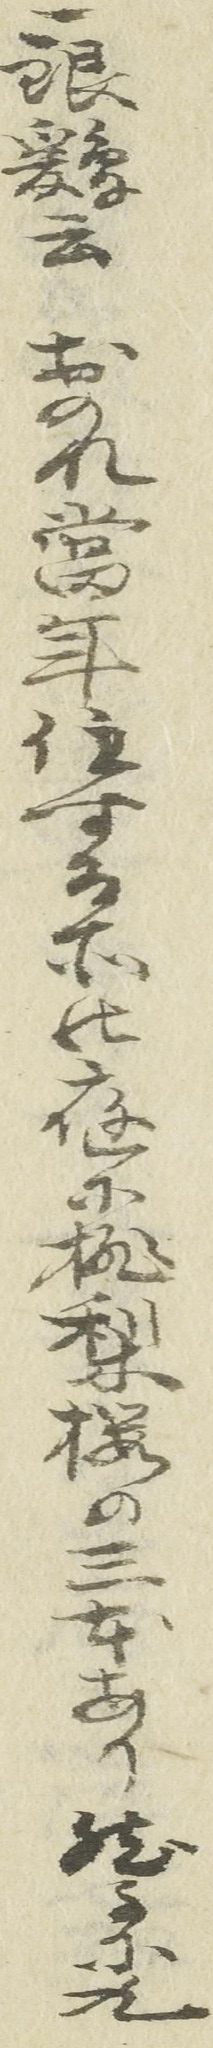一銀鶏云おのれ当年住する所の庭に桃梨桜の三本あり然るに九
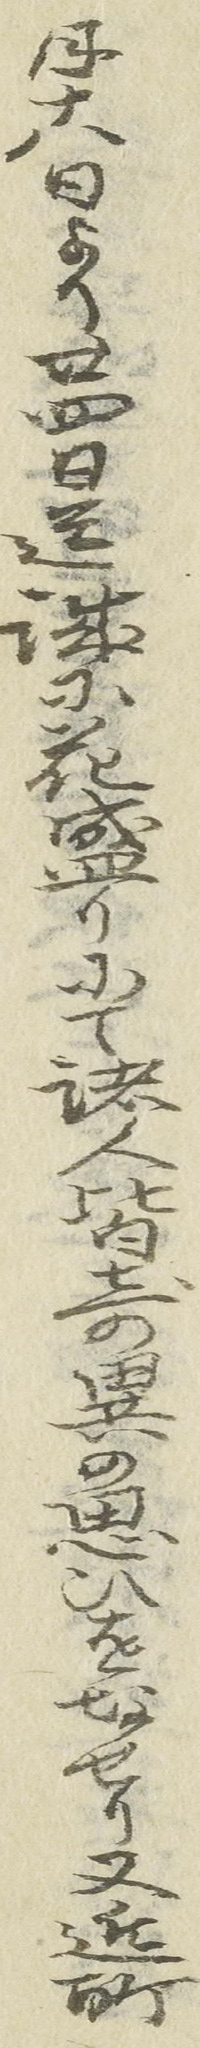月十八日より廿四日迄誠に花盛りにて諸人皆奇異の思ひをなせり又近所
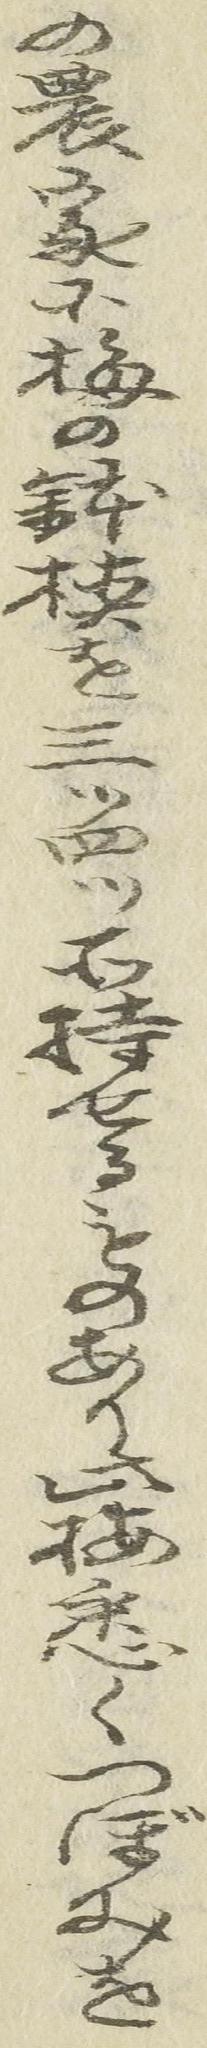の農家に梅の鉢植を三ツ四ツ所持せることのあり此梅悉くつぼみを
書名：地震前兆集　全
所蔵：東京大学地震研究所図書室 Earthquake Research Institute Library, The University of Tokyo, JAPAN
